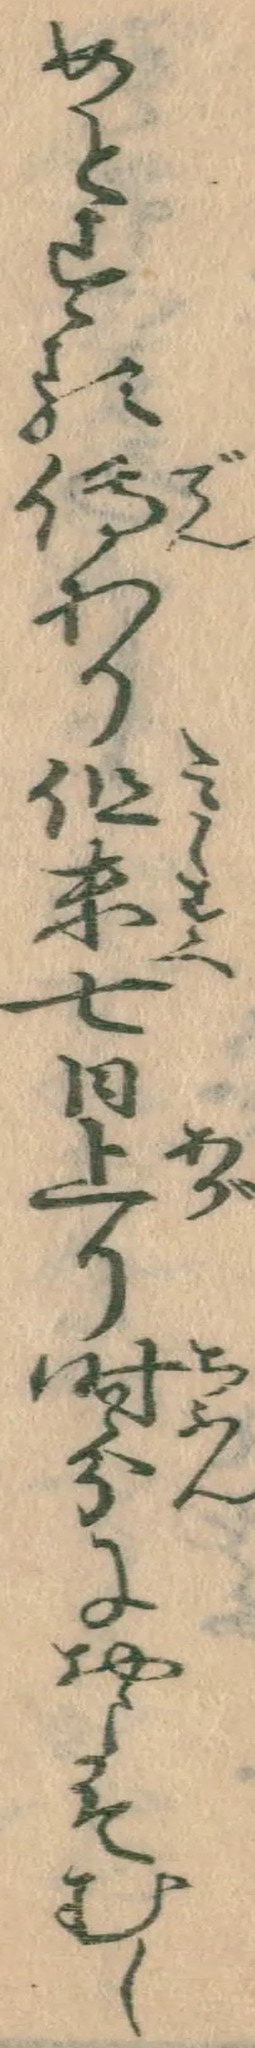めとする伝あり但末七日上り時分におよそむし
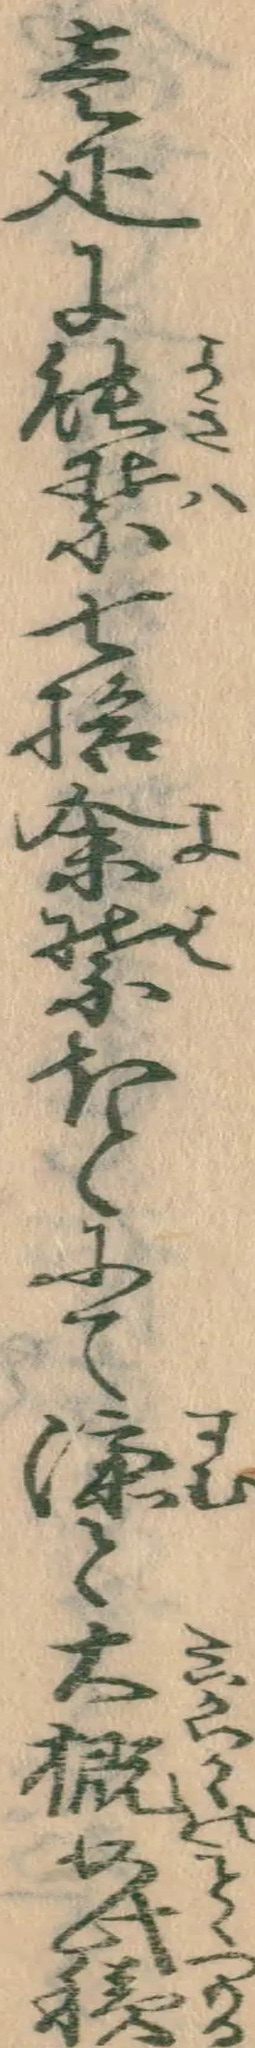壱疋に能葉七拾余葉ほとにて済と大概如此積
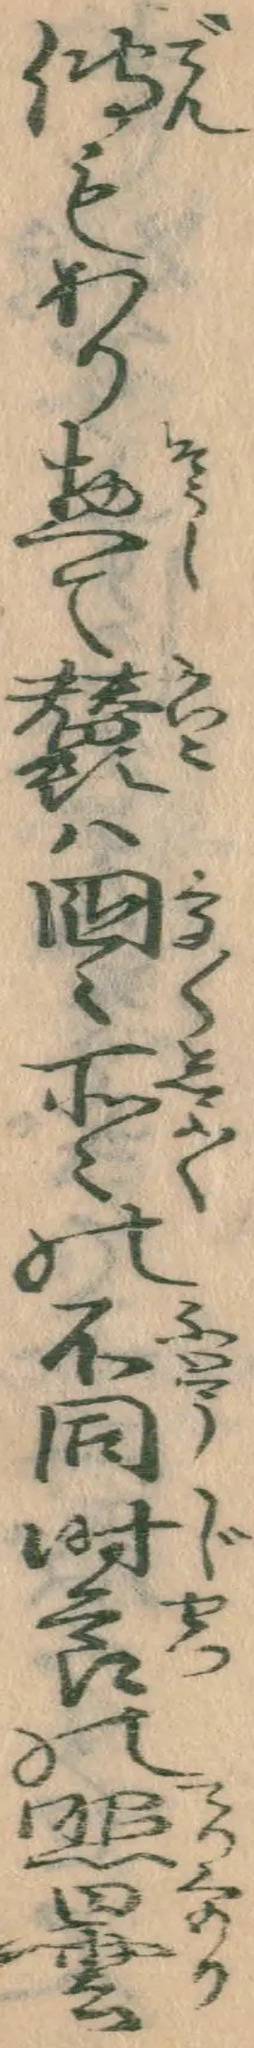伝もあり惣て蚕は国々所々の不同時節の照曇
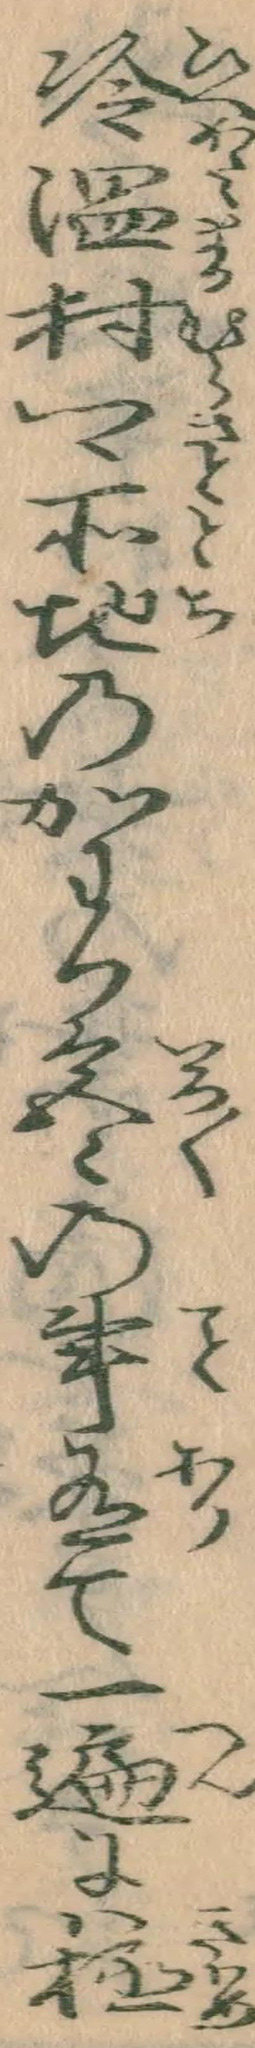冷温村郷所地のかわり色々の事有て一遍には極
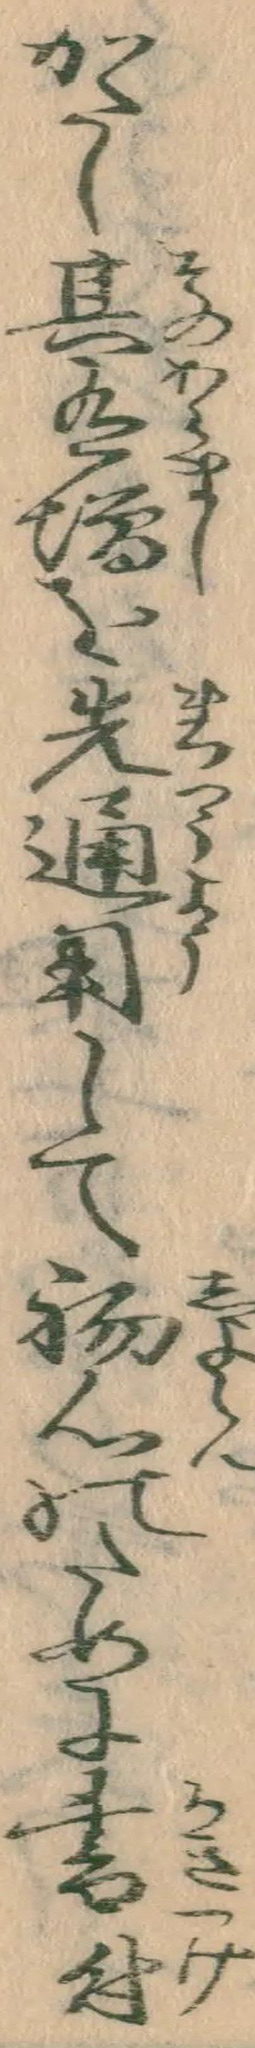かたし其有増を先通用して初心のために書付
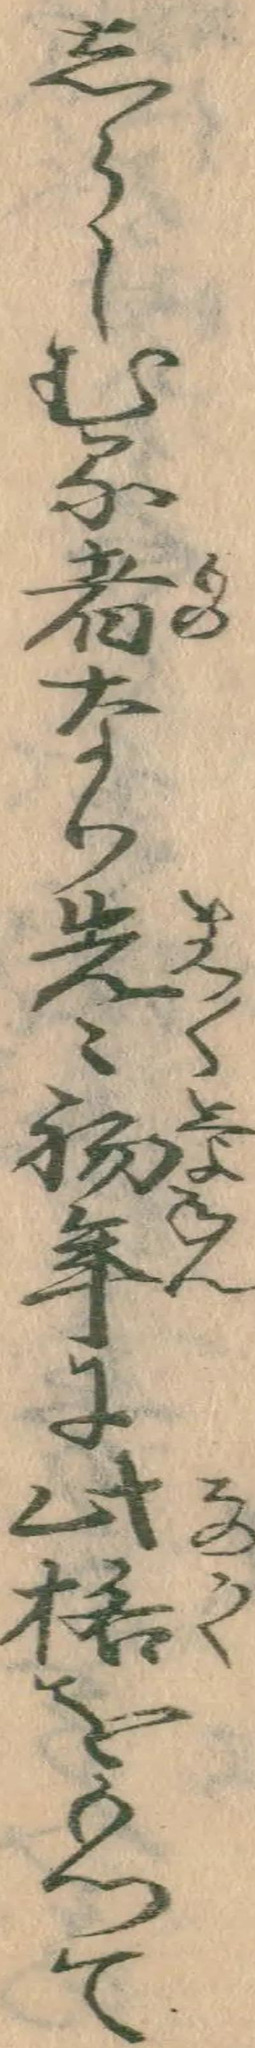しらしむる者なり先々初年に此格をもつて
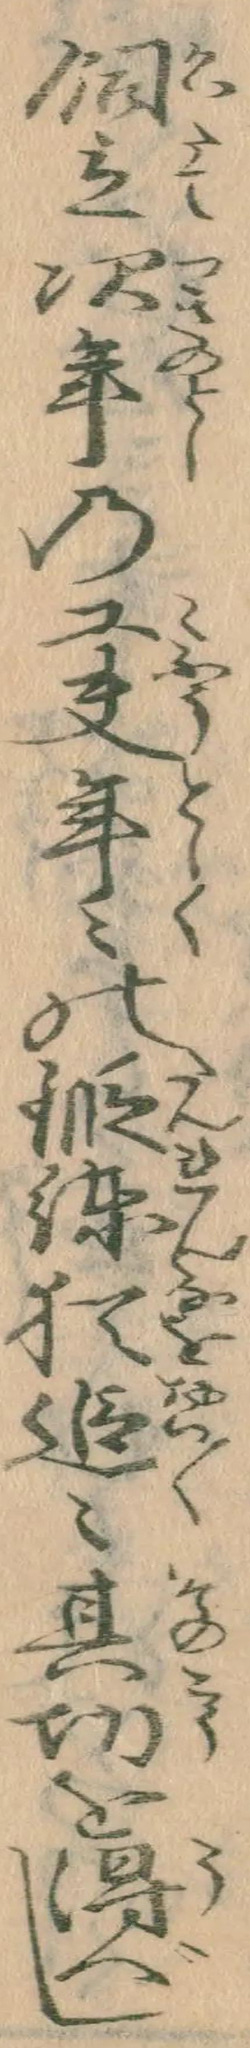飼立次年の工夫年々の鍛練猶追々其功を得べし
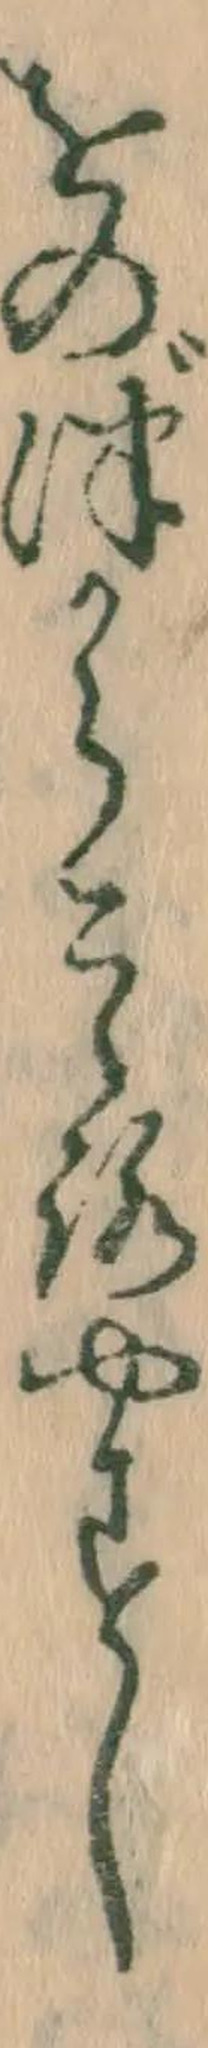をのづからこゝろやすし
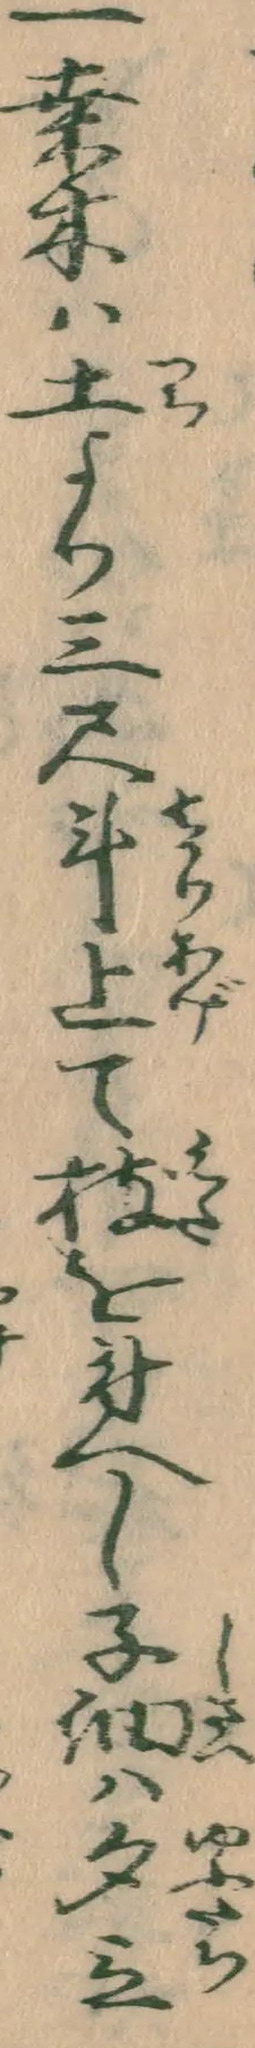一桑木は土より三尺計上て枝を討へし子細は夕立
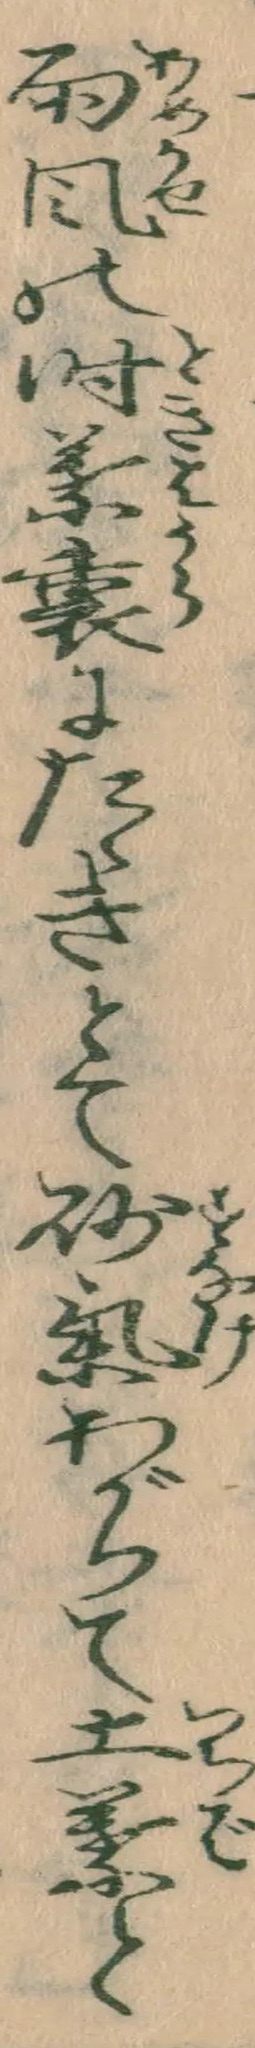雨風の時葉裏にたゝきとて砂気あがりて土葉と
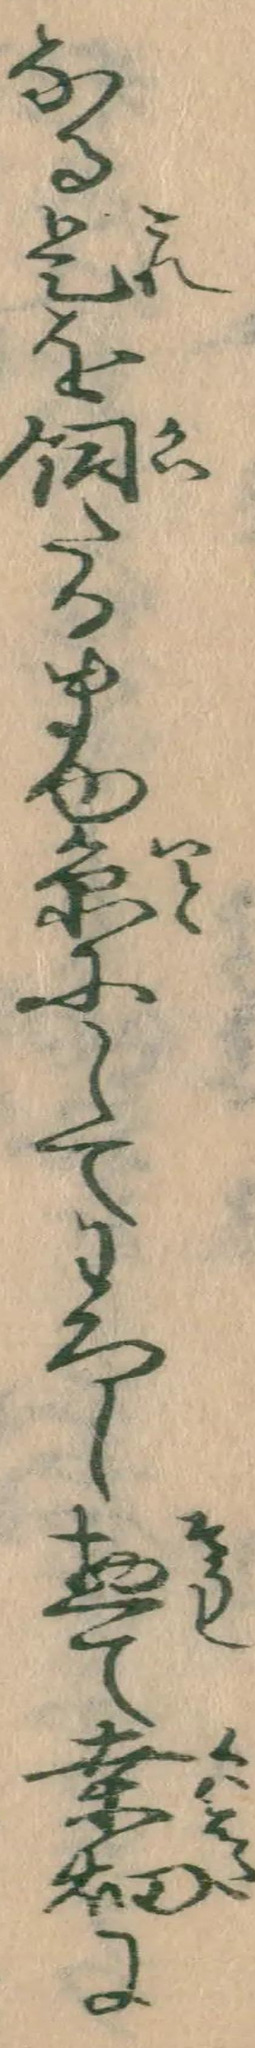なる是を飼たるまゆ糸にしてわろし惣て桑畑に
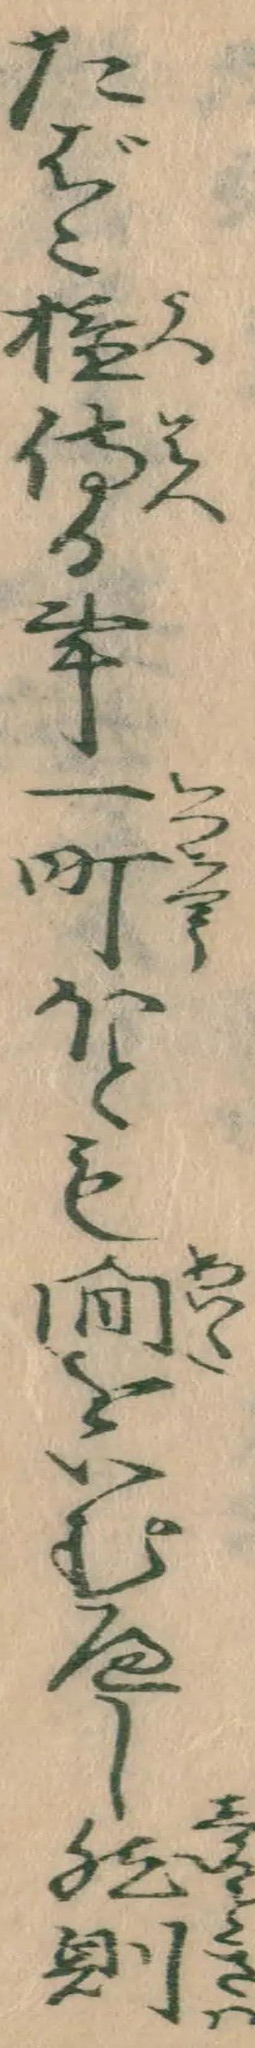たばこ植侍る事一町ほとも間をいむへし然則
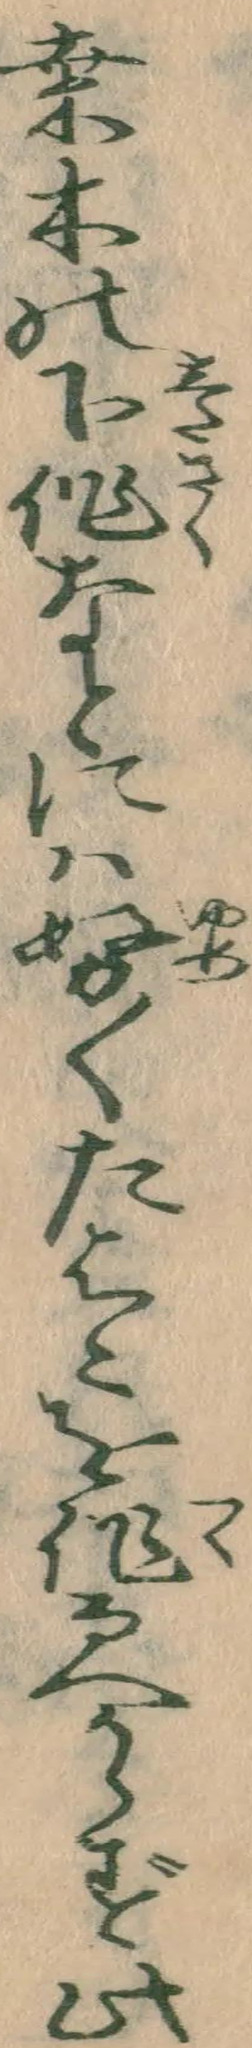桑木の下作なとには努〳〵たはこを作るへからず此
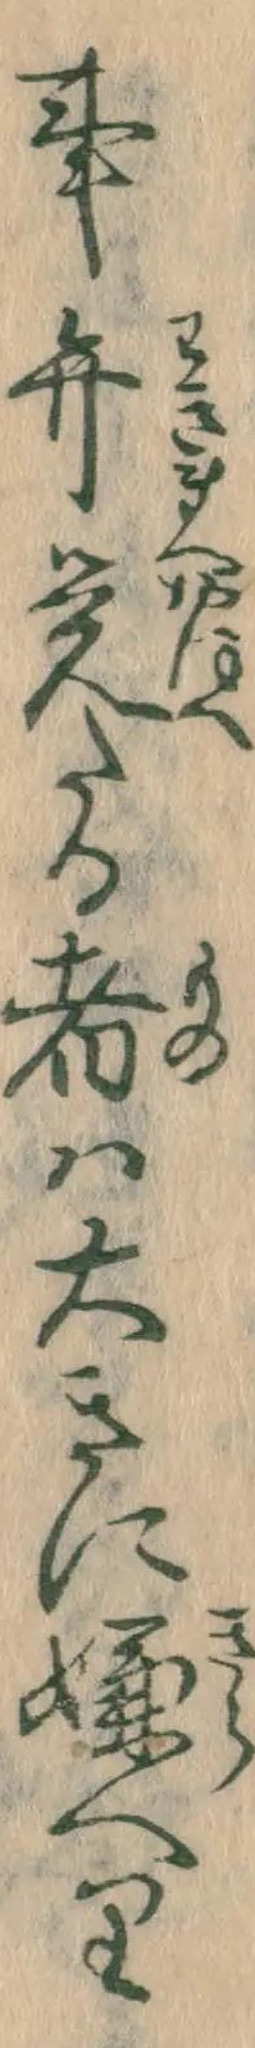事弁覚たる者は大きに嫌へり
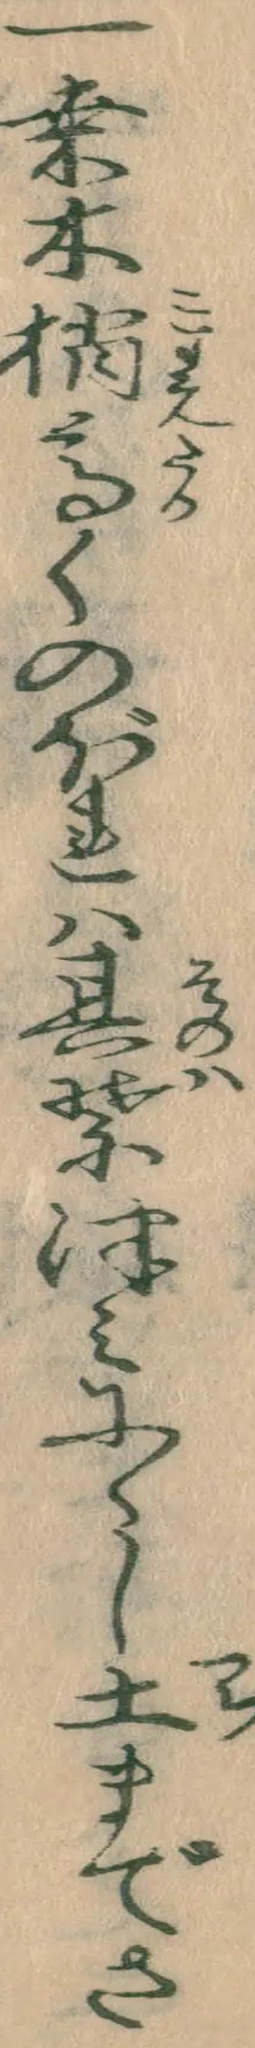一桑木梢高くのぼれは其葉つみにくし土までさ
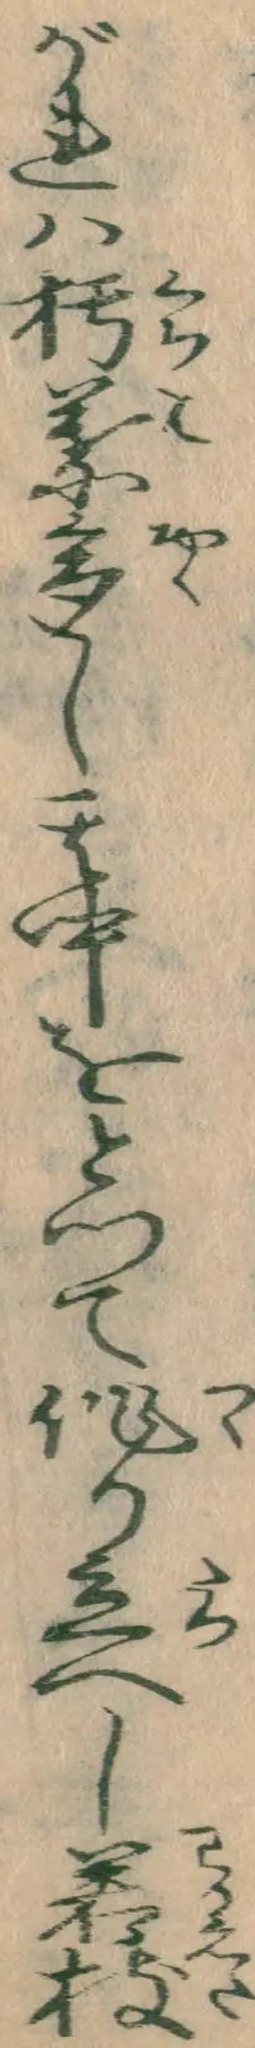がれは朽葉多し其中をとつて作り立へし若枝
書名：蚕飼養法記
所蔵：国立国会図書館 National Diet Library, JAPAN
